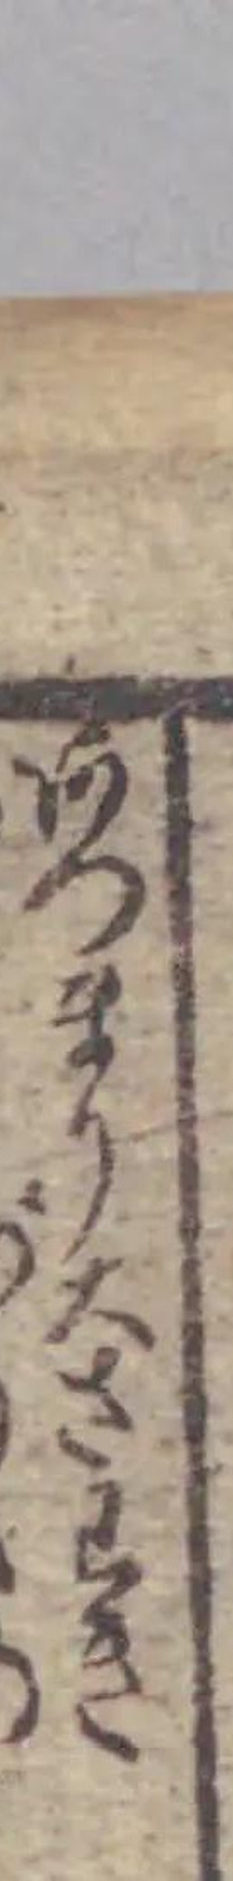あつまり大さわき
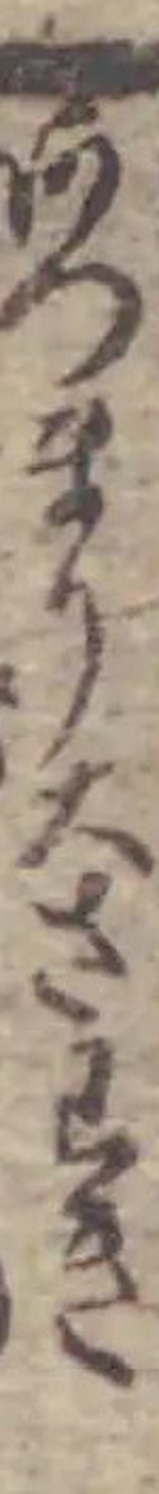あつまり大さわき
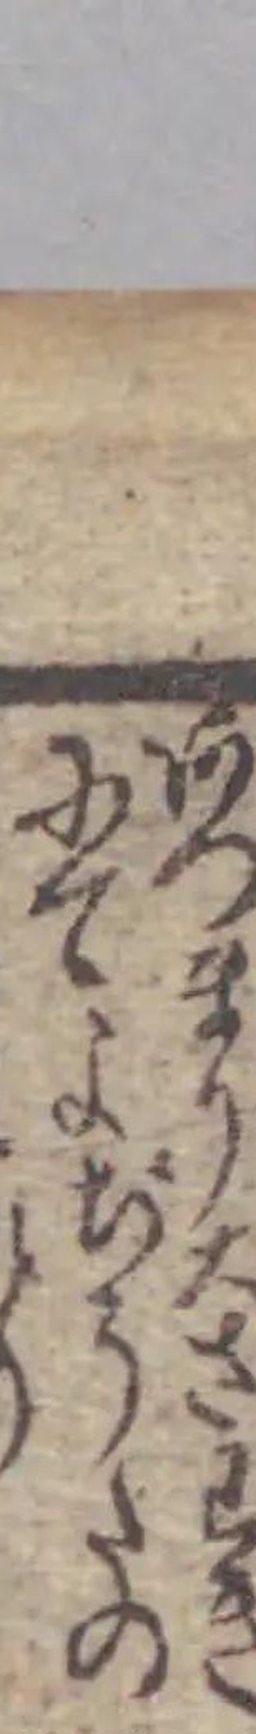にてよぢうたの
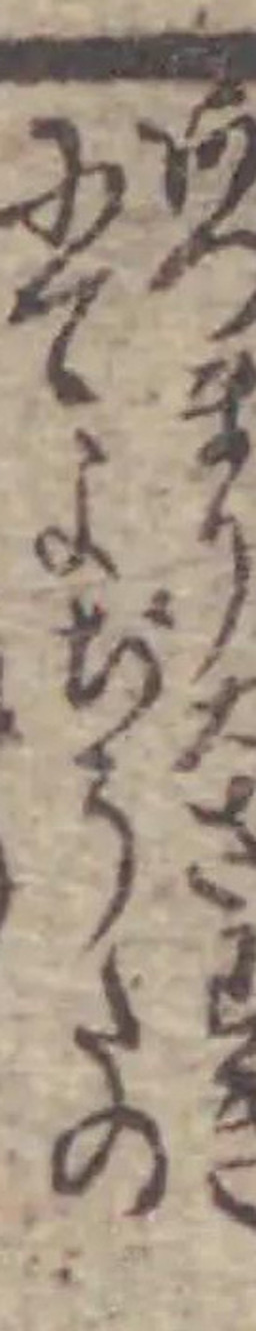にてよぢうたの
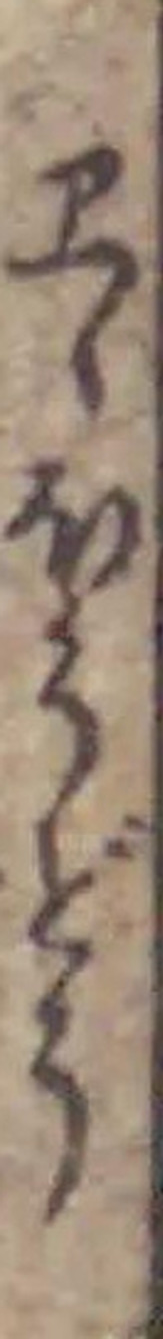ヱゝほうどう
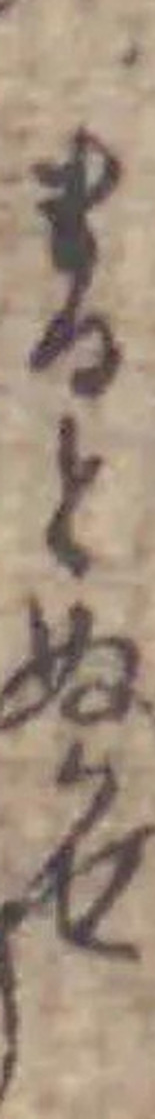まるとぬかせ
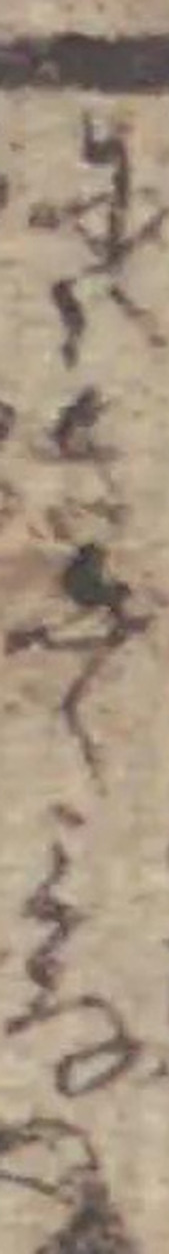にはきやくみな
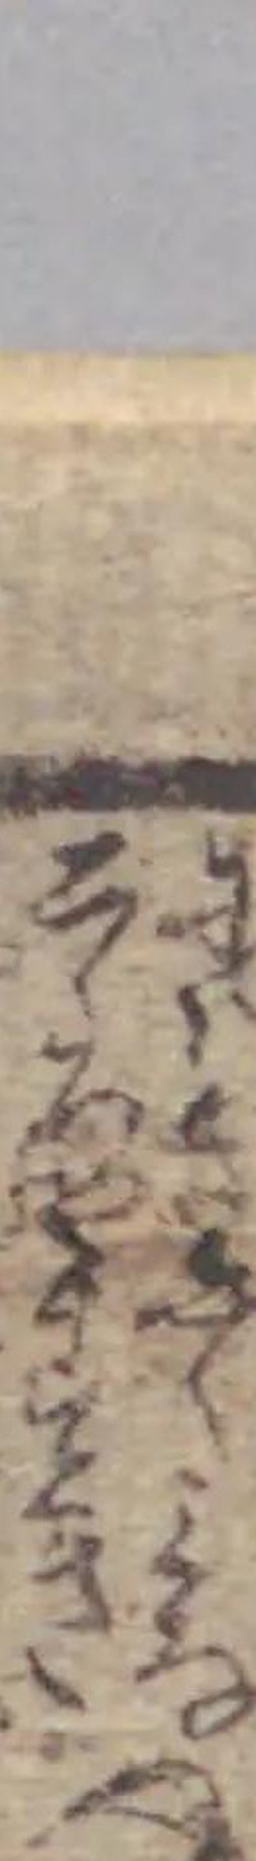こゝろやすき
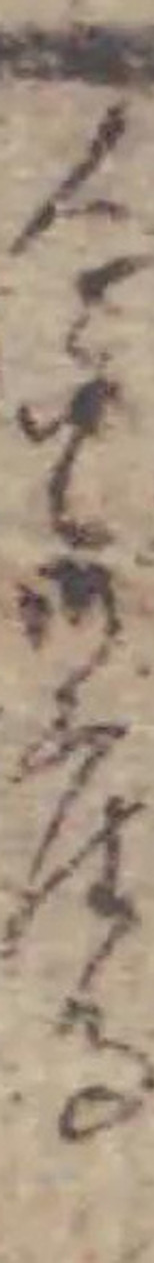人とて御座る
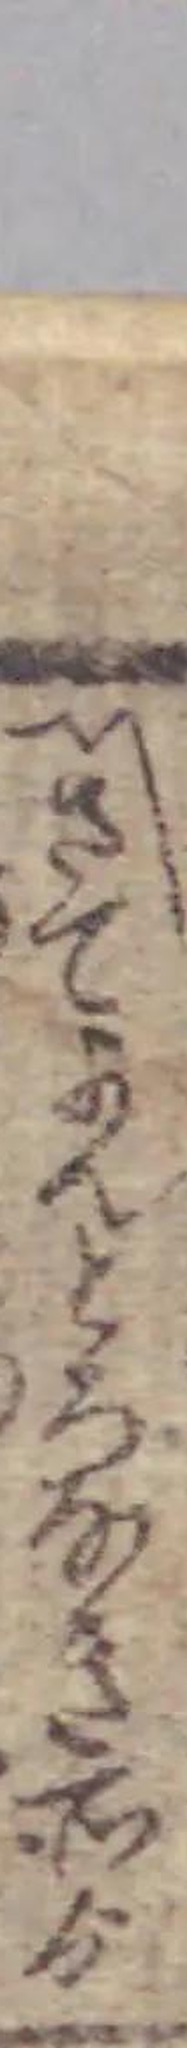「さてよんとこなき所より
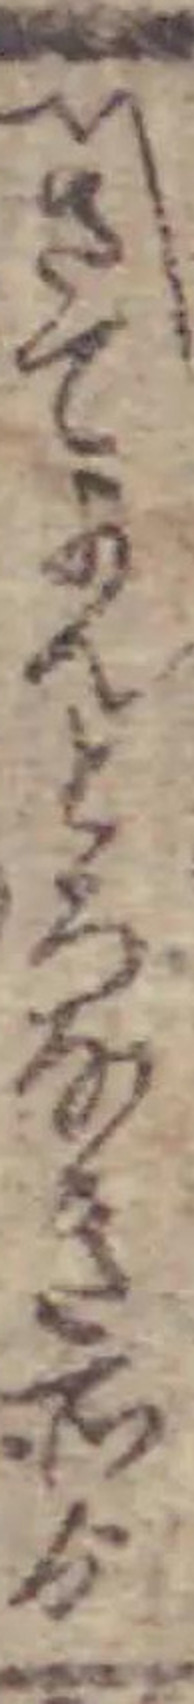「さてよんとこなき所より
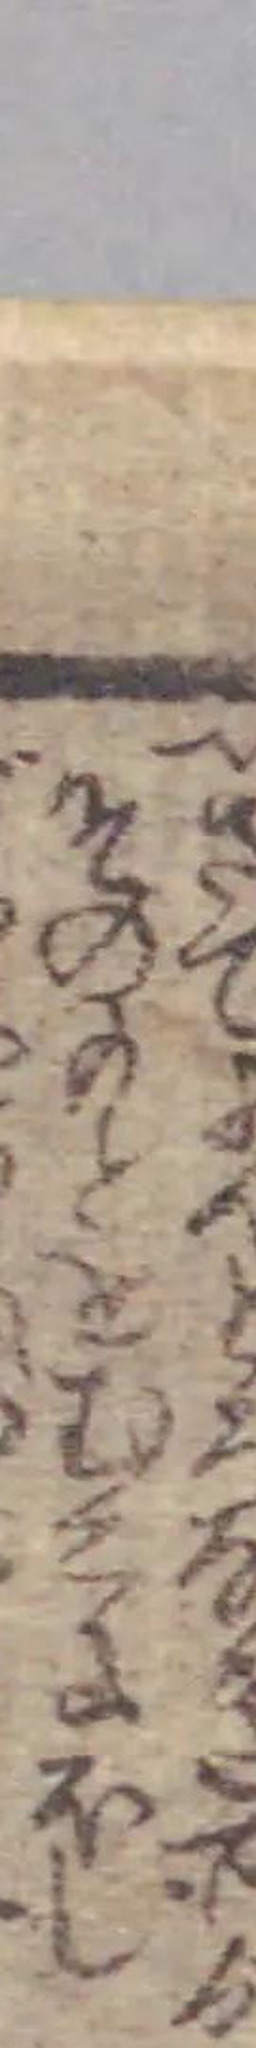そのもとをむこにほし
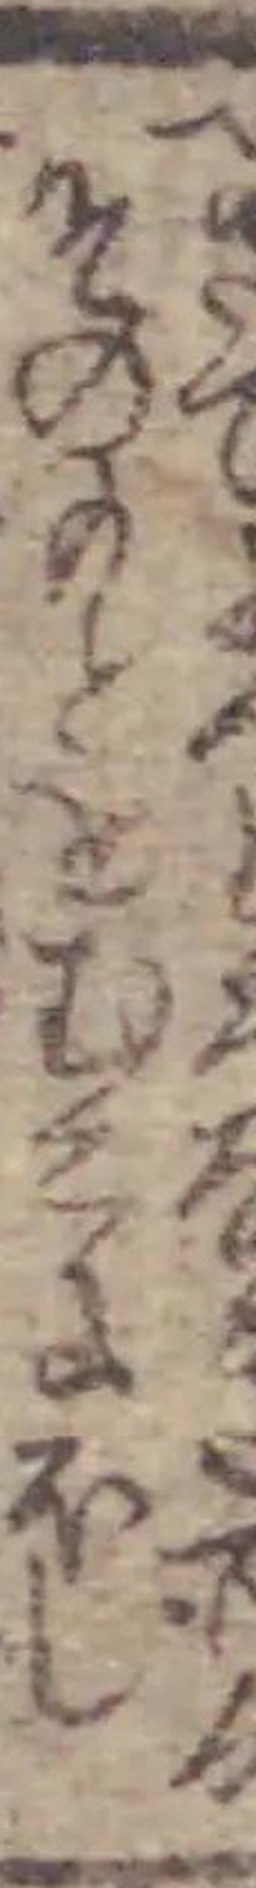そのもとをむこにほし
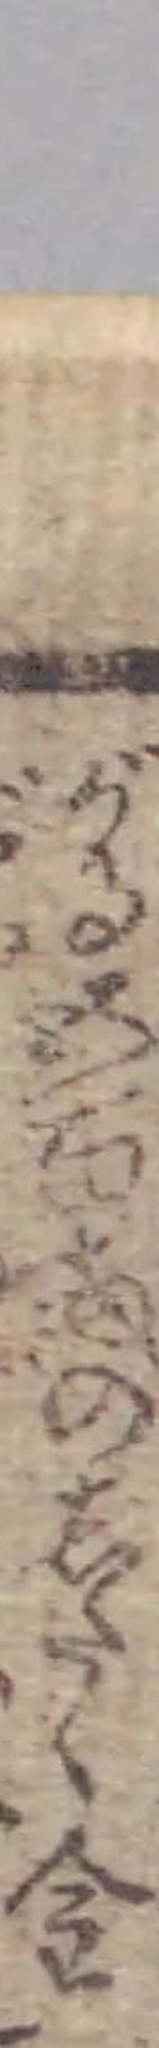がる五百両のしたく金
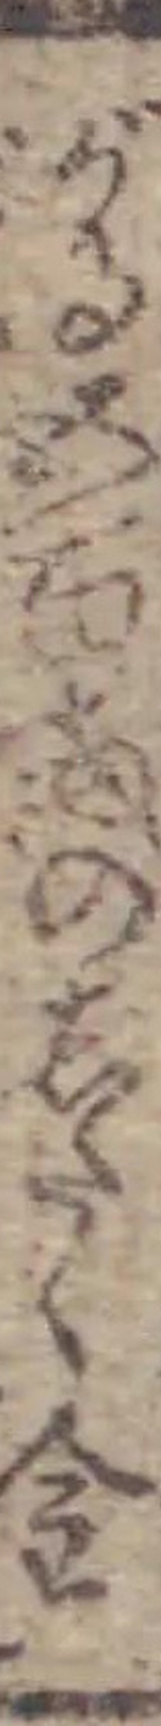がる五百両のしたく金
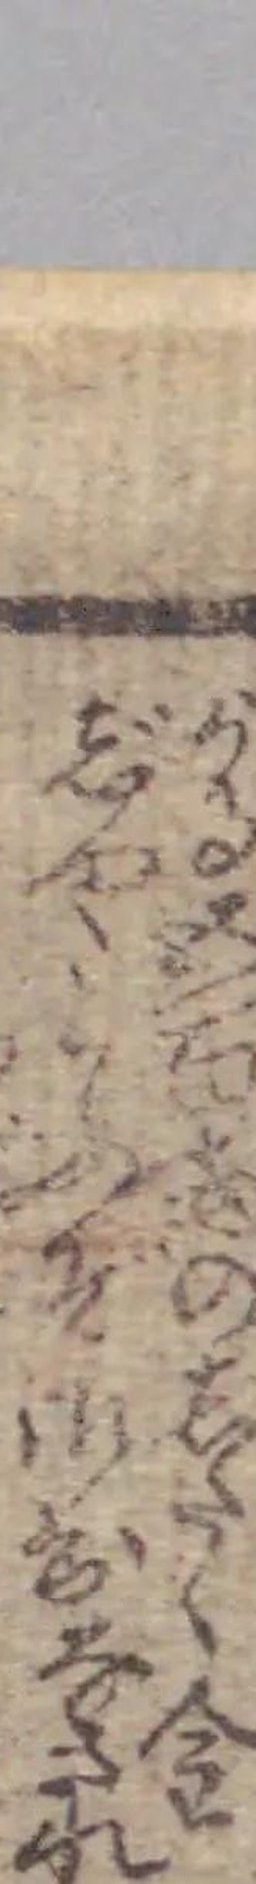じやとふぞ御出なされ
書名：日待御利生此ごろ噂 3巻
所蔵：国立国会図書館 National Diet Library, JAPAN
